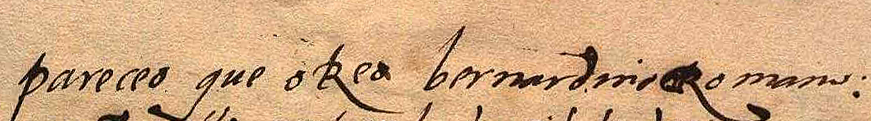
pareceo que o Reo bernardino Romano
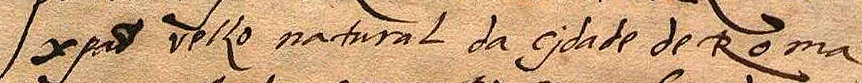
xpaõ velho natural da cjdade de Roma
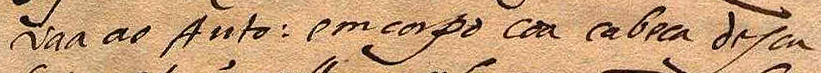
vaa ao Auto: em corpo coa cabeça descu
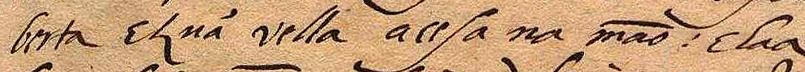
berta e huā vella acesa na mão: E laa
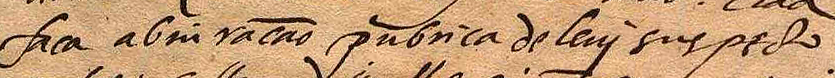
faça abiuração pubrica de leuj suspecto
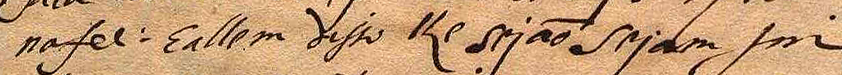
na fee: E allem disso lhe sejaõ sejam Jm
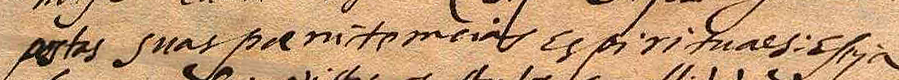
postas suas pænitemcias Espirituaes: E seya
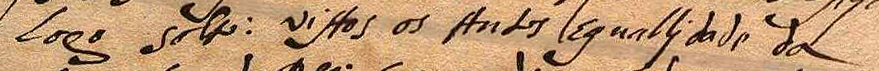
logo solto: vistos os Autos E qualljdade da
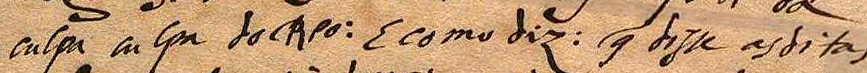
culpa culpa do Reo: E como diz q̄ disse as ditas
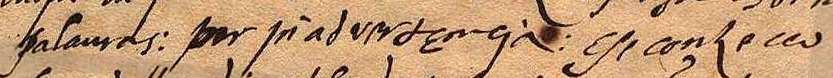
palauras por jnadvertEmcja E se conheceo
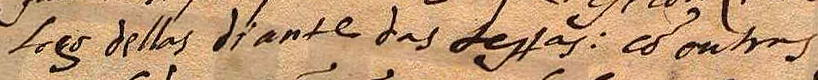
logo dellas diante das testas cō outras
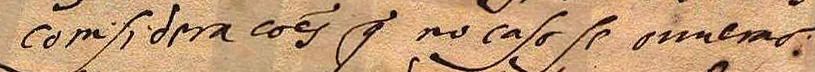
comsideraçoẽs q̄ no caso se ouueraõ
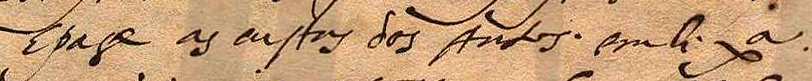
E page as custas dos Autos. Em lixa
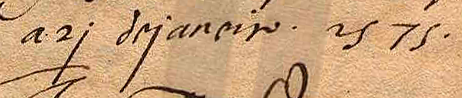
a 2i de janeiro 1575.
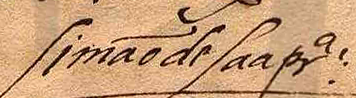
Simão de Saa pra.
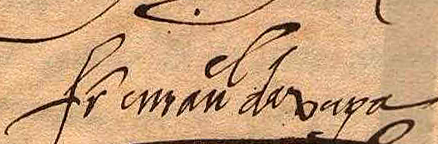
fr̄ emanel da veiga
